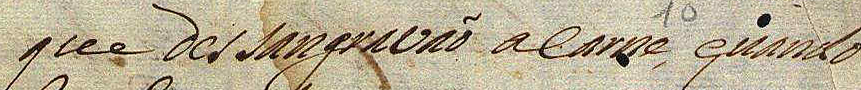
que dessangravaõ a carne, quando
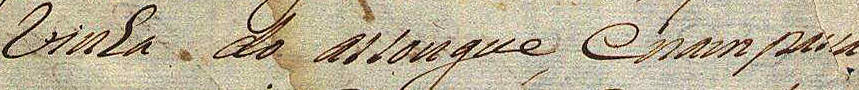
Vinha do assougue, e nam passa
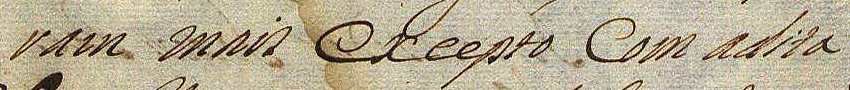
ram mais excepto com a dita
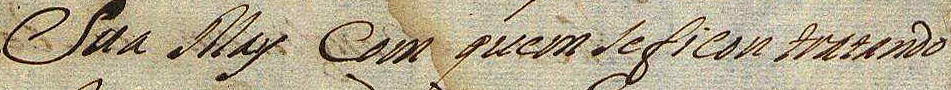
Sua May com quem se ficou tratando
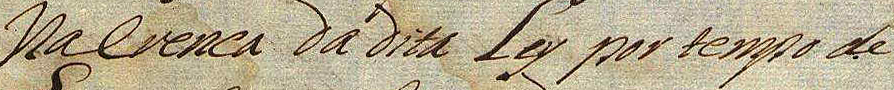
na crenca da dita Ley por tempo de
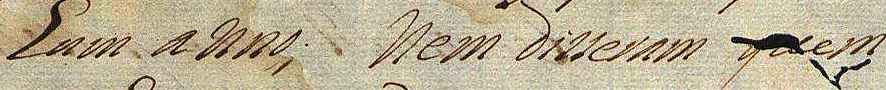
hum anno; nem disseram quem
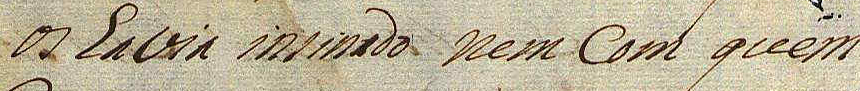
os havia insinado nem com quem
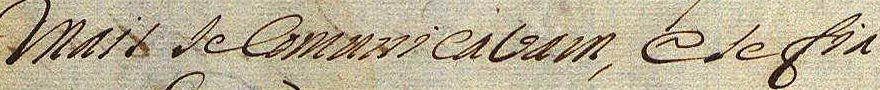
mais se comunicavam, e se fia
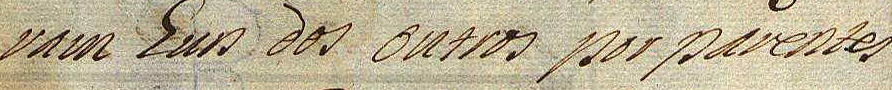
ram huns dos outros por parentes
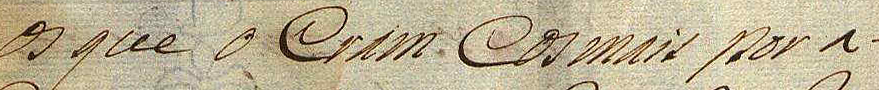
os que o eram e os mais por a
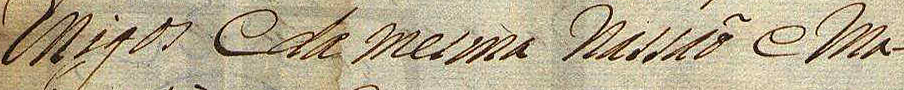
migos e da mesma nassaõ e ma
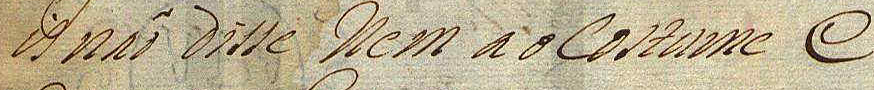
is naõ disse nem ao costume e
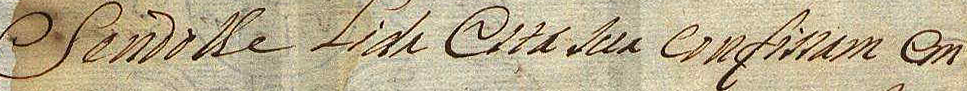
Sendolhe Lida esta sua confissam em
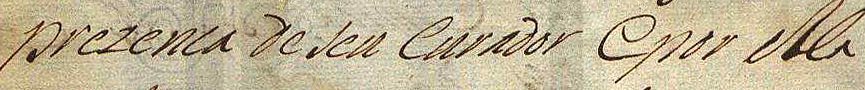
prezenca de seu curador e por ella
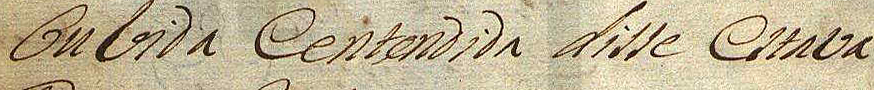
Ouvida e entendida disse estava
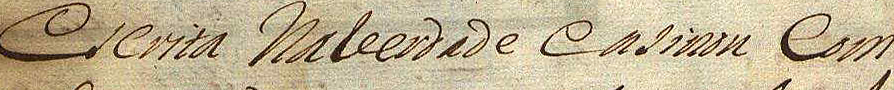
escrita na verdade e asinou com
